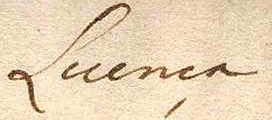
Licença
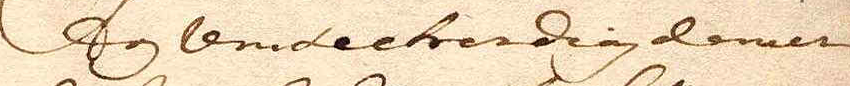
Aos vinte e trez dias do mez
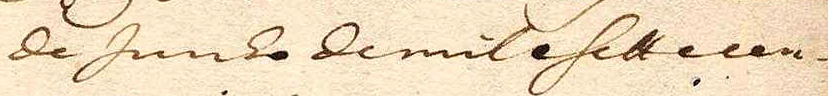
de Junho de mil e settecen
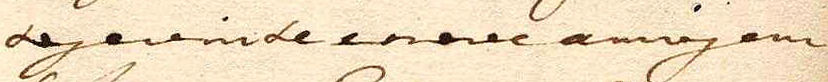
tos e vinte e nove annos em
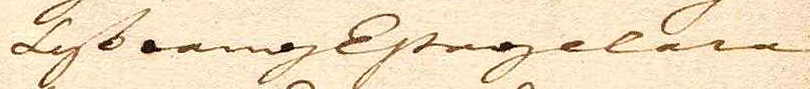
Lisboa nos Estaos e Caza
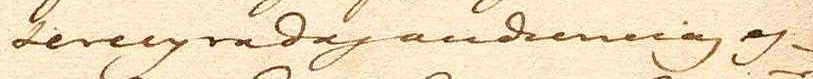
terceyra das audiencias es
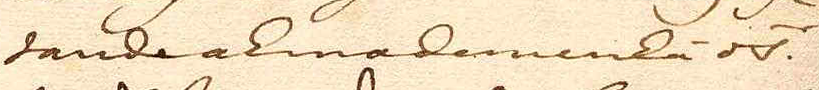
tando ahi na de menhã o S.or
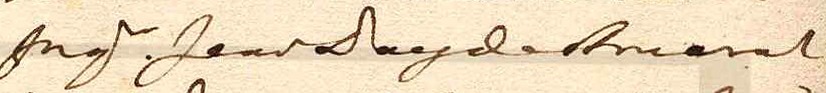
Jnqr. Joaõ Paes do Amaral
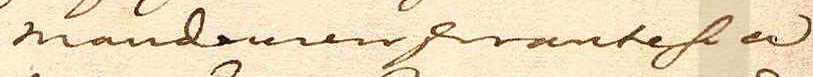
mandou vir perante si a
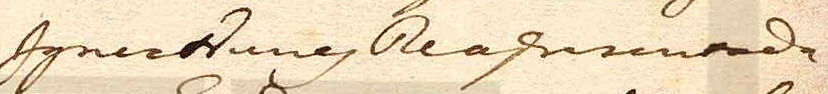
Jgnez Nunes Re aprezentada
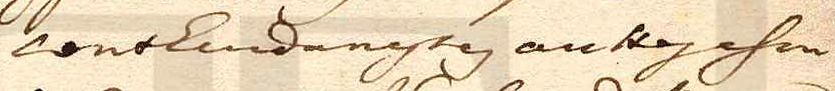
contheuda nestes auttos e sen
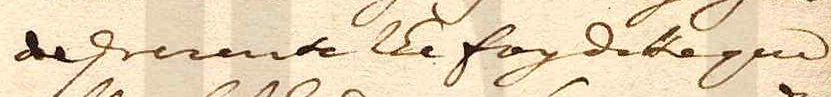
do prezente lhe foy dito que
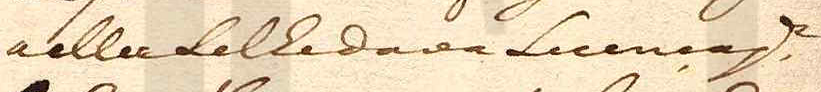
a ella se lhe dava Licença p.r
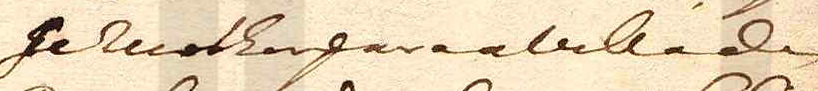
se Recolher para a villa de
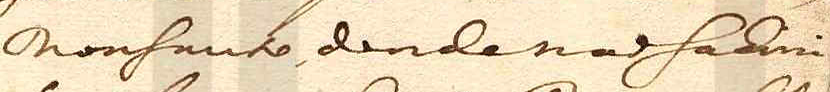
Monsanto, donde naõ sahiria
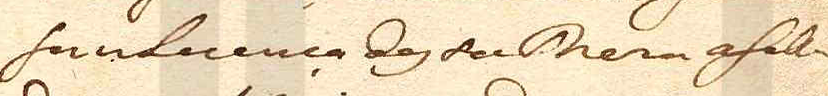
sem lecença desta Meza a falla
